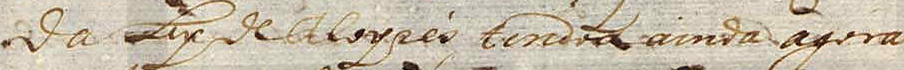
da Ley de Moyzés, tendoa ainda agora
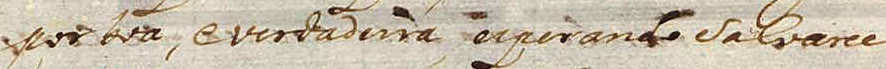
por boa, e verdadeira, esperando salvarce
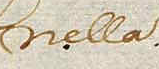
nella.
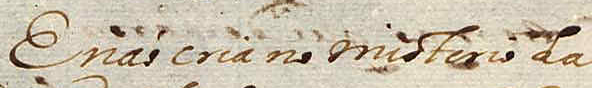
E naõ cria no Misterio da
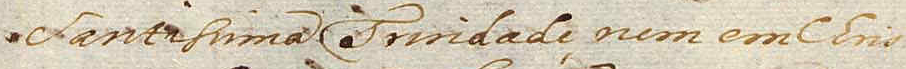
Santissima Trindade, nem em Chris
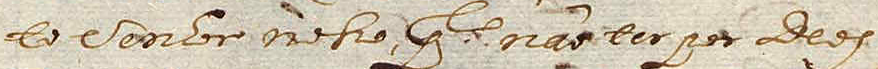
to Senhor nosso, p.lo naõ ter por Deos
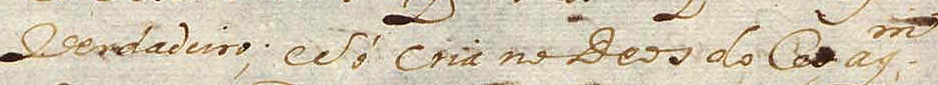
Verdadeiro; e Só cria no Deos do Ceo, a qm
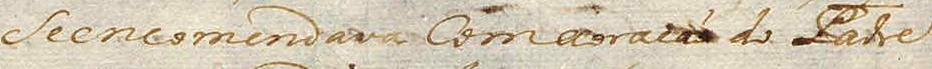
se encomendava Com o coraçaõ do Padre
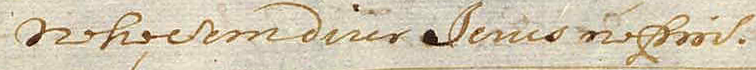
nosso, sem dizer Iesus no fim.
